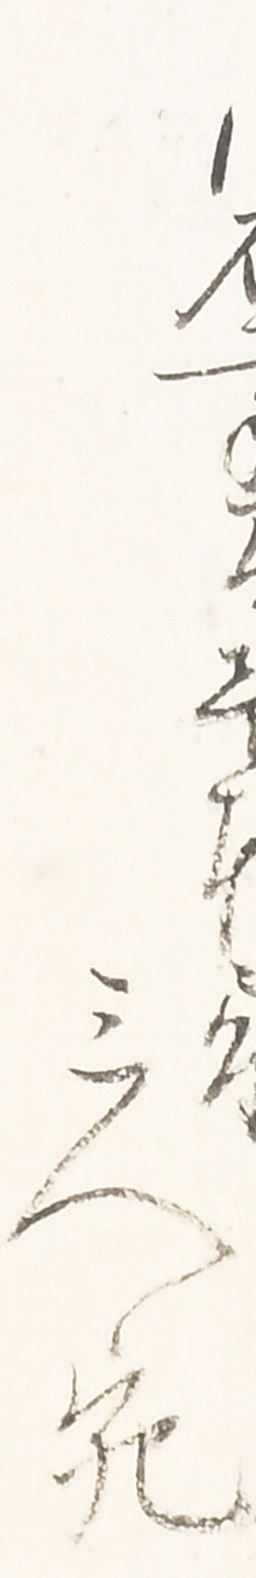三人宛
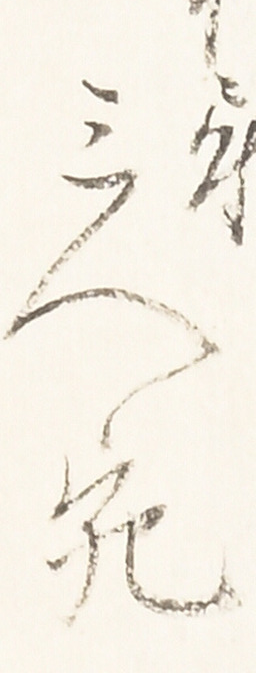三人宛
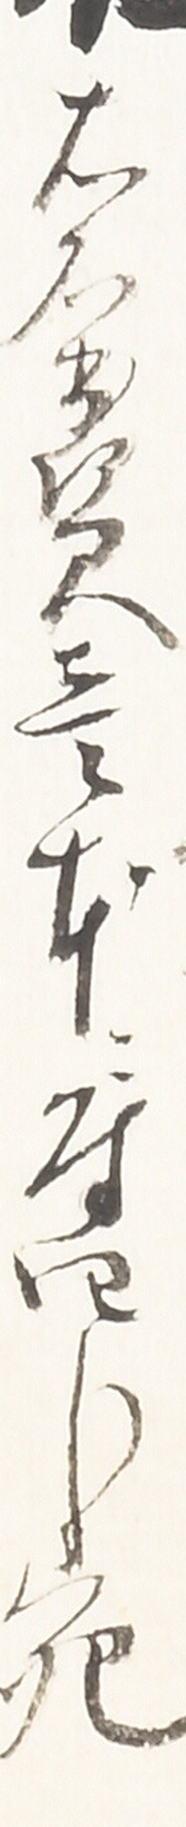但右石出賃壱本ニ付四分宛
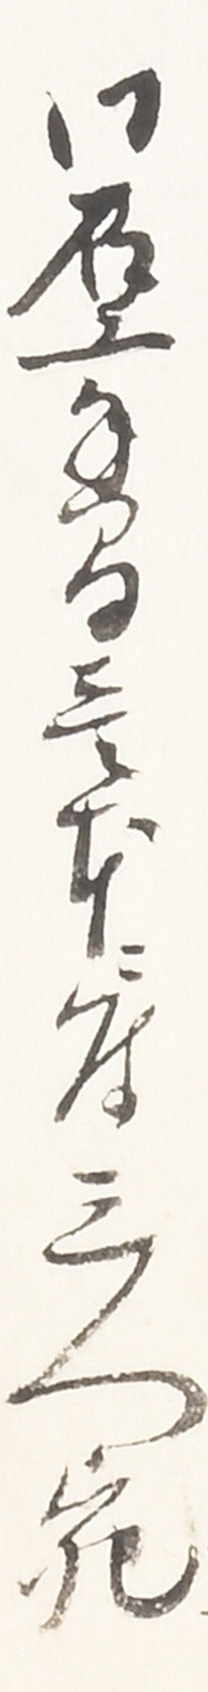同石工手間壱本ニ付三人宛
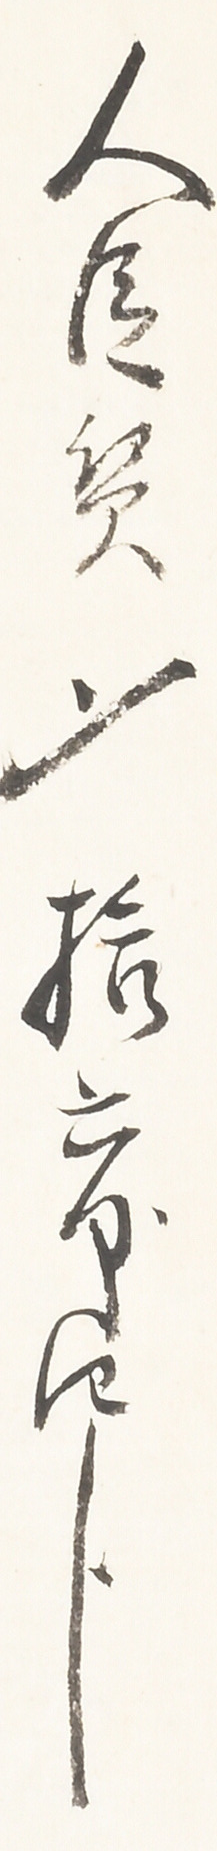人足賃〆拾六匁四分
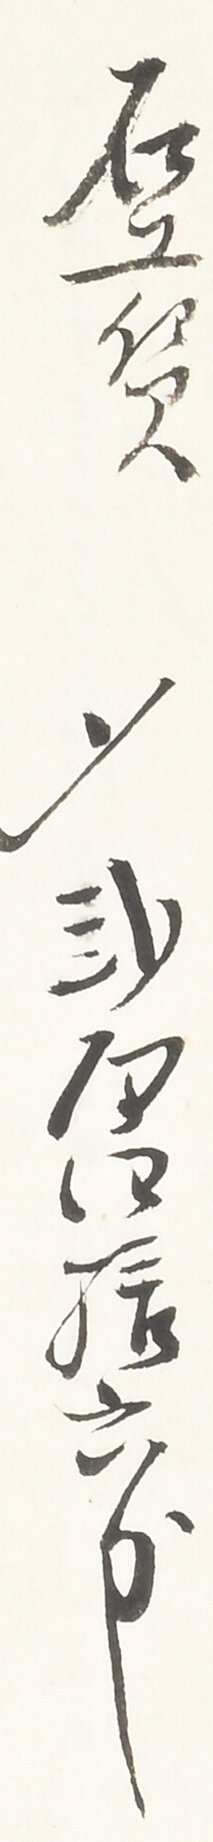石工賃〆弐百四拾六匁
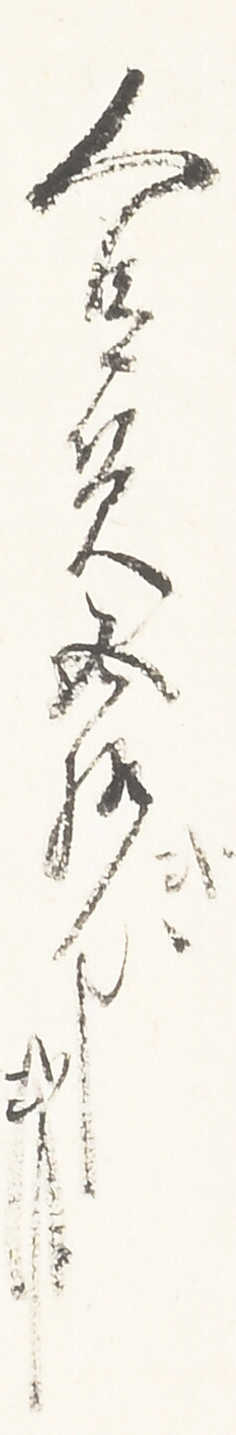人足賃〆拾六匁四分
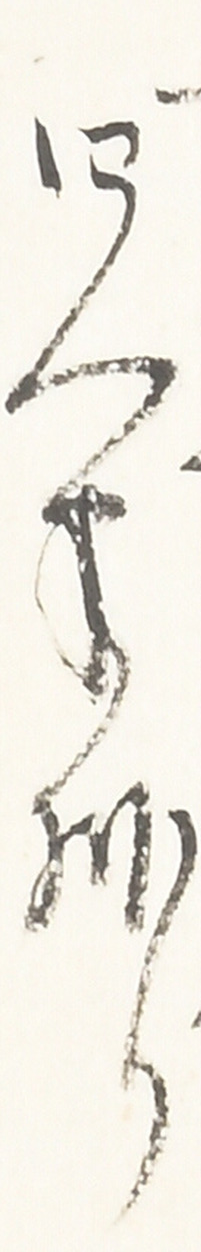四人半掛り
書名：天保十亥年六月武田信玄公玉垣仕用書上帳
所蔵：伊那市立高遠町図書館・合同会社AMANE
